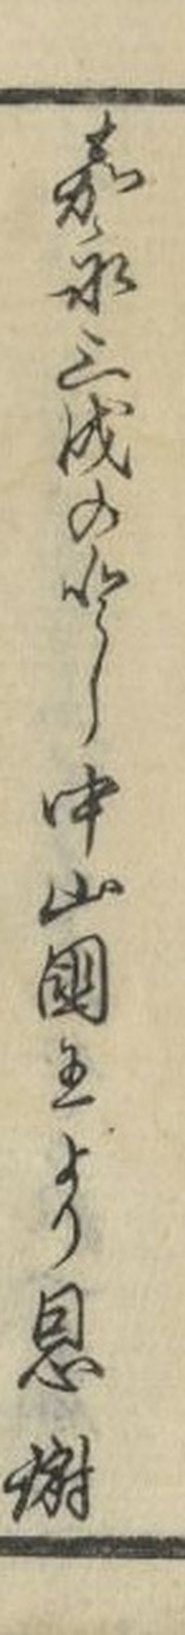嘉永三戌のとし中山国王より恩謝
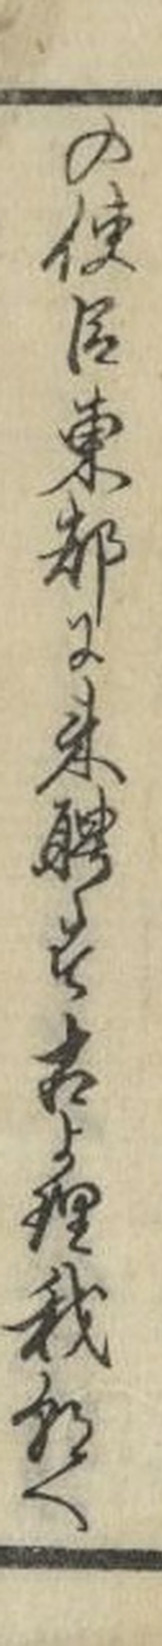の使臣東都に来聘す古より我朝へ
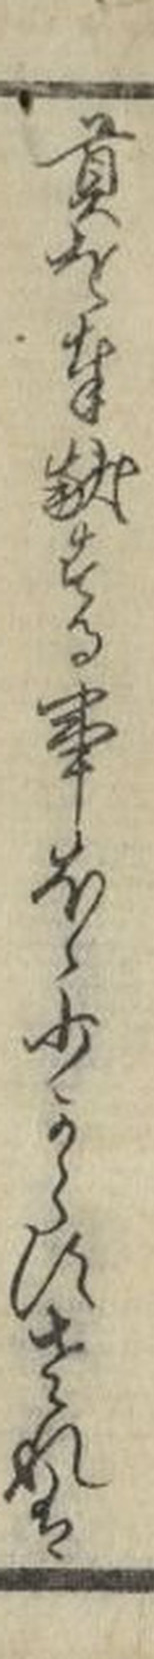貢を奉献する事ほゝ少からすされは
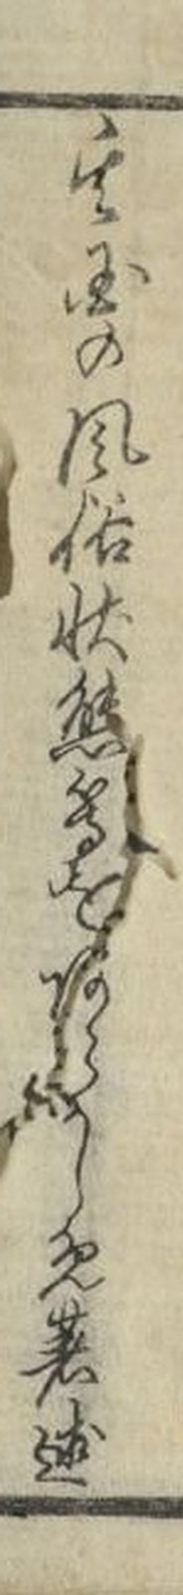其国の風俗状態等をあらかしめ著述
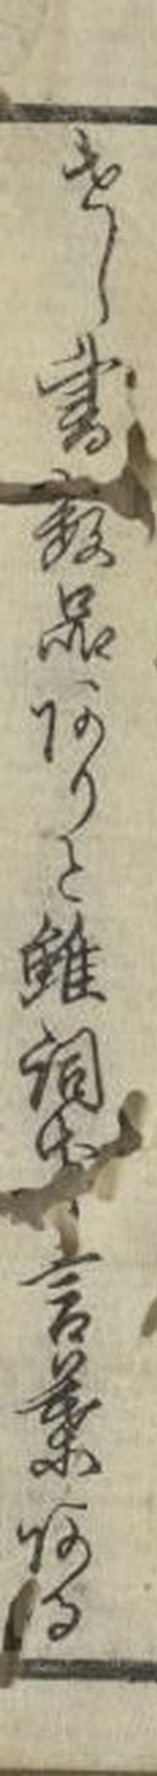せし書数品ありと雖詞言葉ある

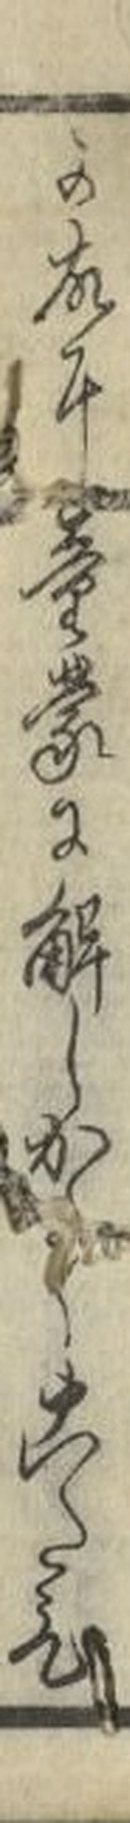かゆえに童蒙に解しかたくこたひ
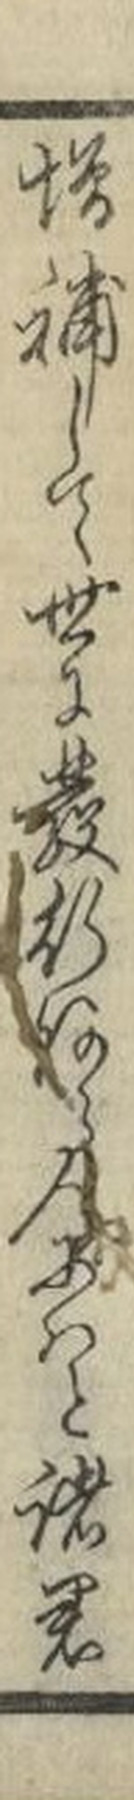増補して世に発行あらんにはと諸君
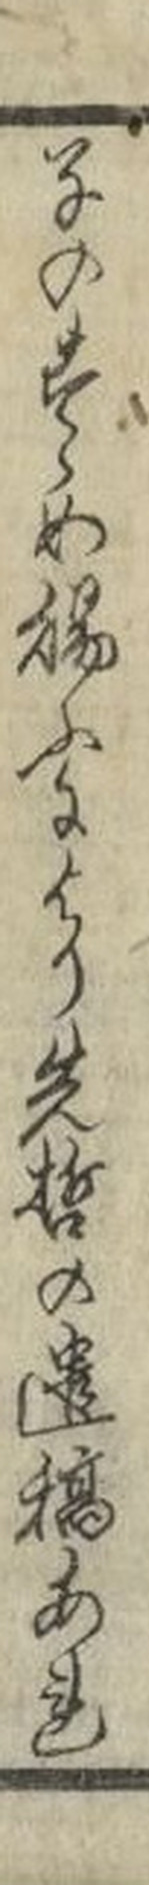子のすゝめ賜ふにはり先哲の遺稿あれ
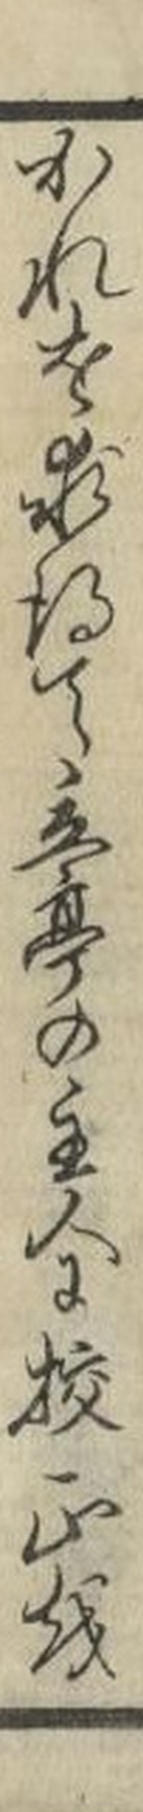かれを求得て立亭の主人に校正を
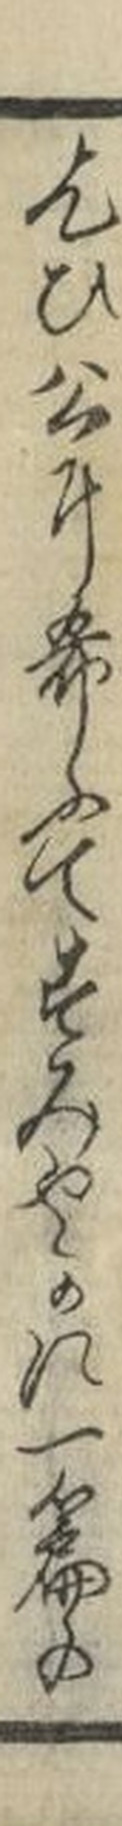乞ひ公に希ふてすみやかに一篇の
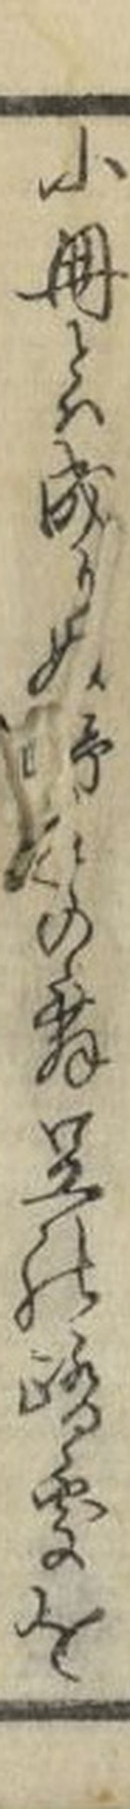小冊とは成りぬの舞足の踏処を
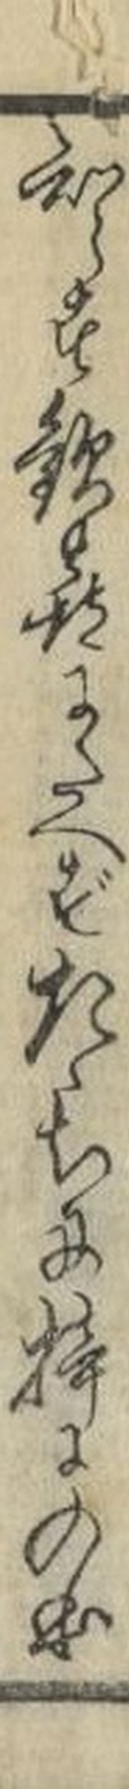知らす歓喜にたへずたゝちに梓にの
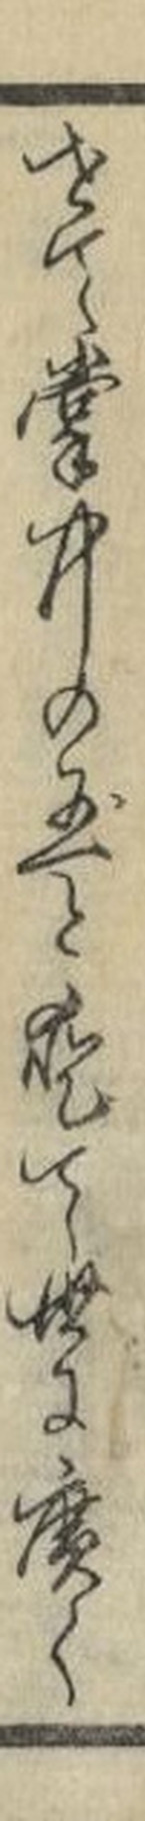せて掌中の玉とて世に広く
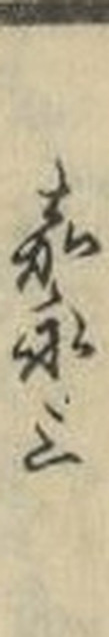嘉永三
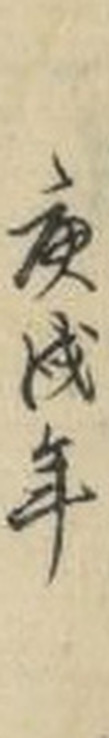庚戌年
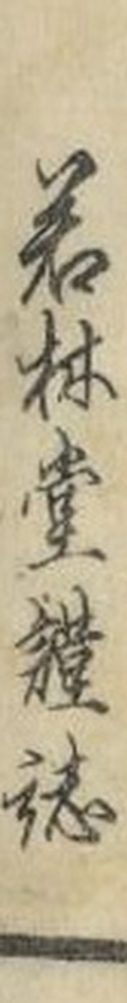若林堂謹誌
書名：琉球解語
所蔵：University of the Ryukyus Library
